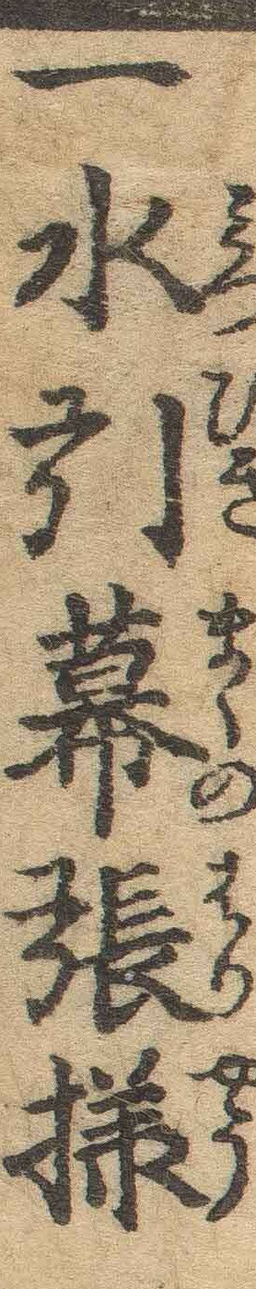一水引幕張様

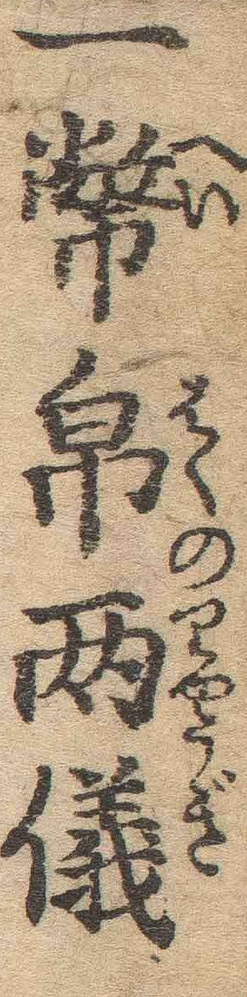一幣帛両儀
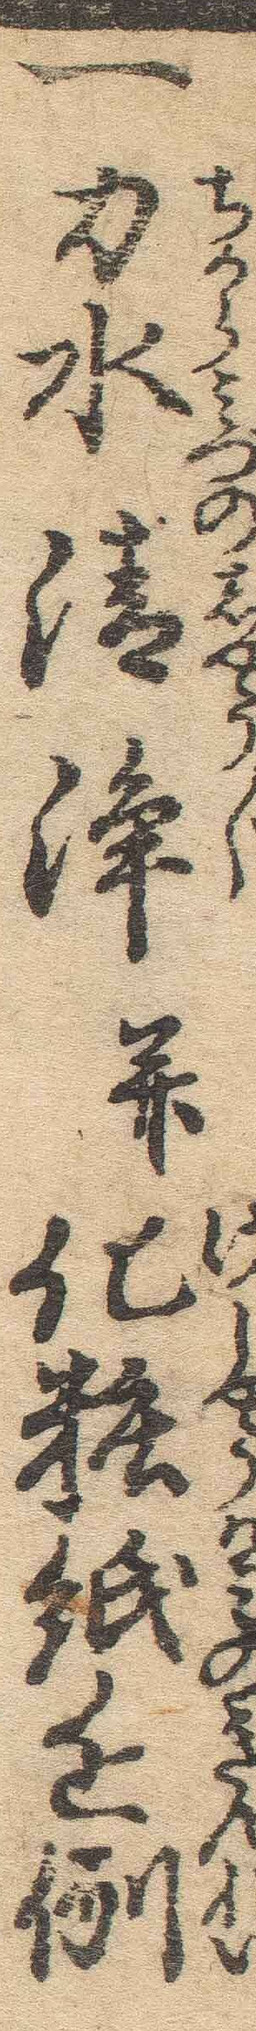一力水清淨并化粧紙近例
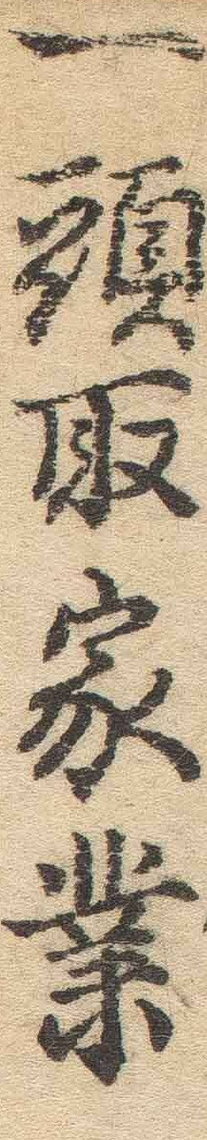一頭取家業
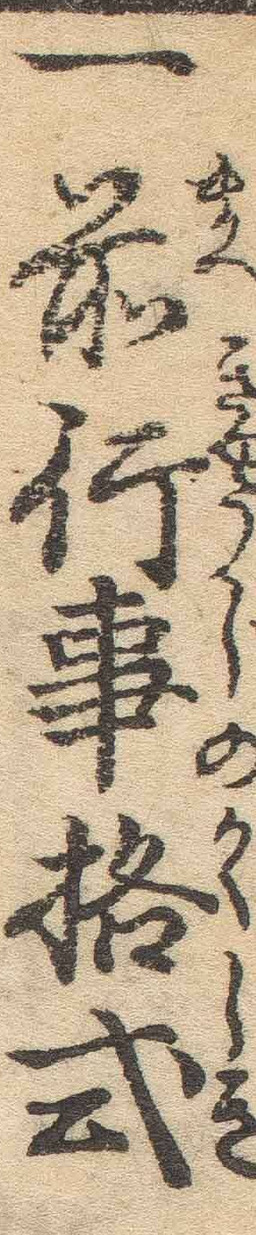一前行事格式
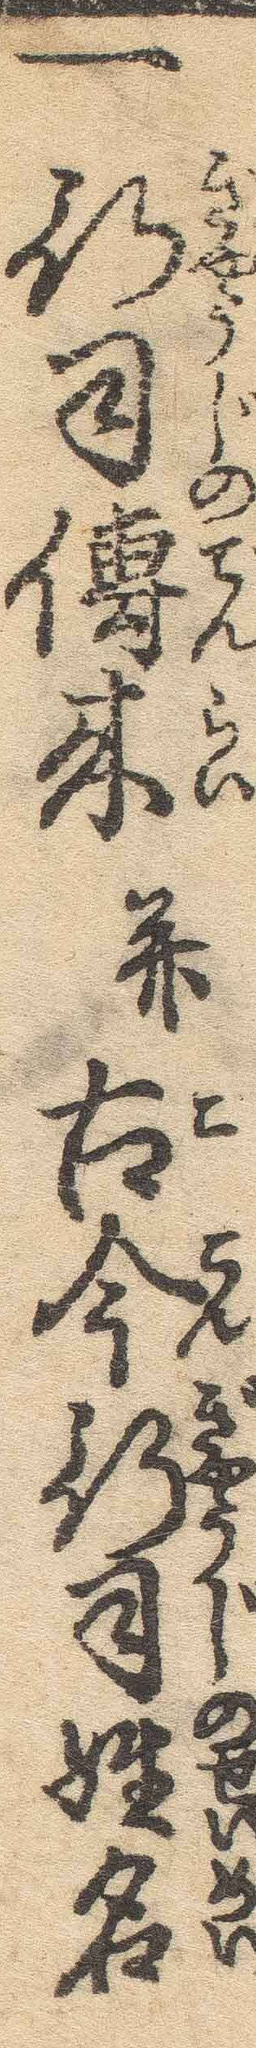一行司伝来并古今行司姓名
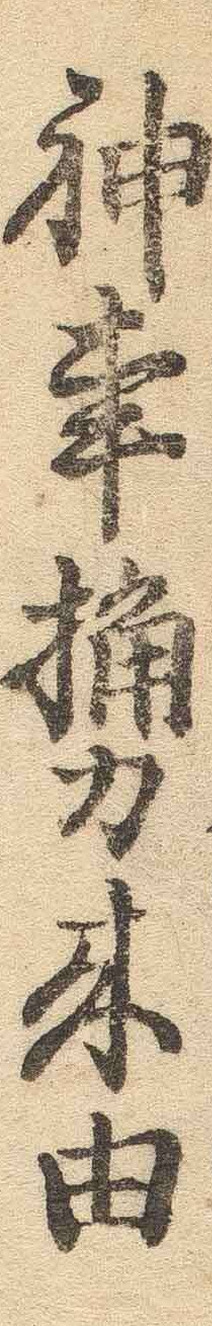神事捔力来由
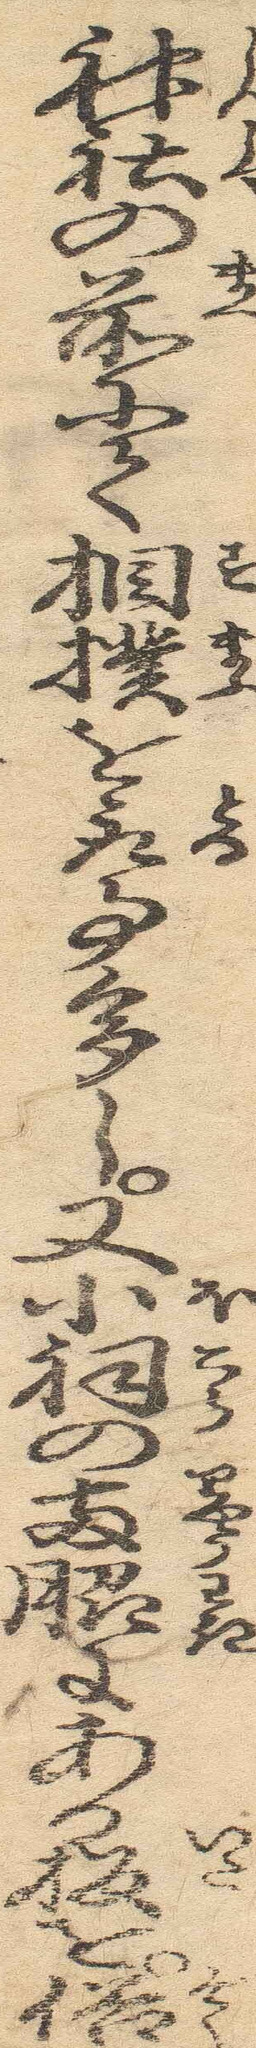神社の前にて相撲を取事多し。又小祠の両脇にある板を。俗
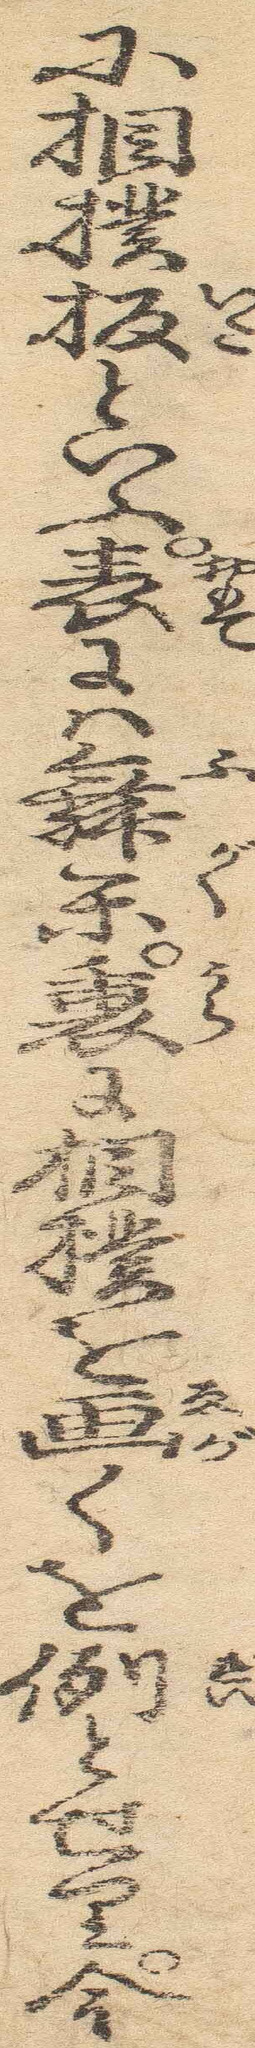に相撲板といふ。表には舞楽。裏に相撲を画くを例とせり。今
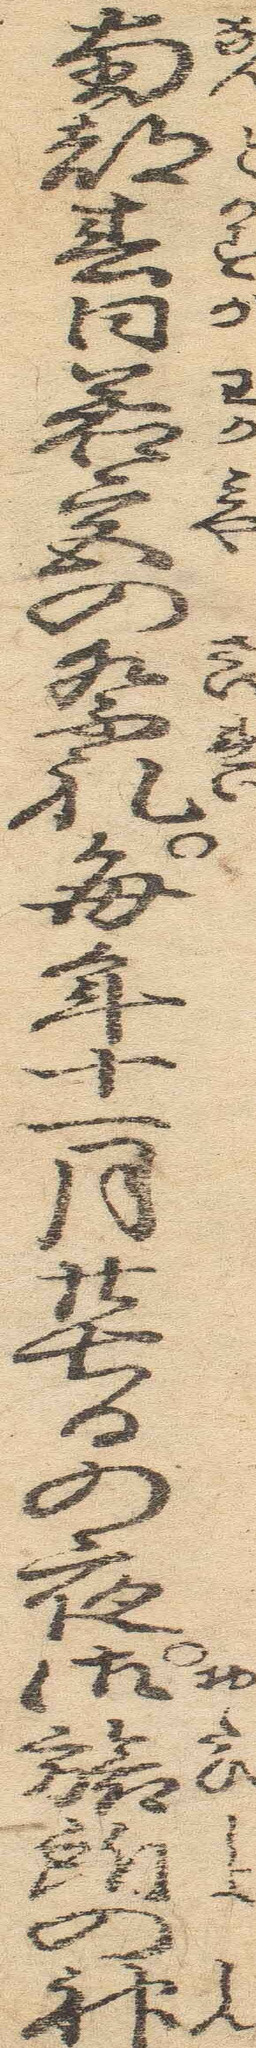南都春日若宮の祭礼。毎年十一月廿七日の夜。御旅所の神
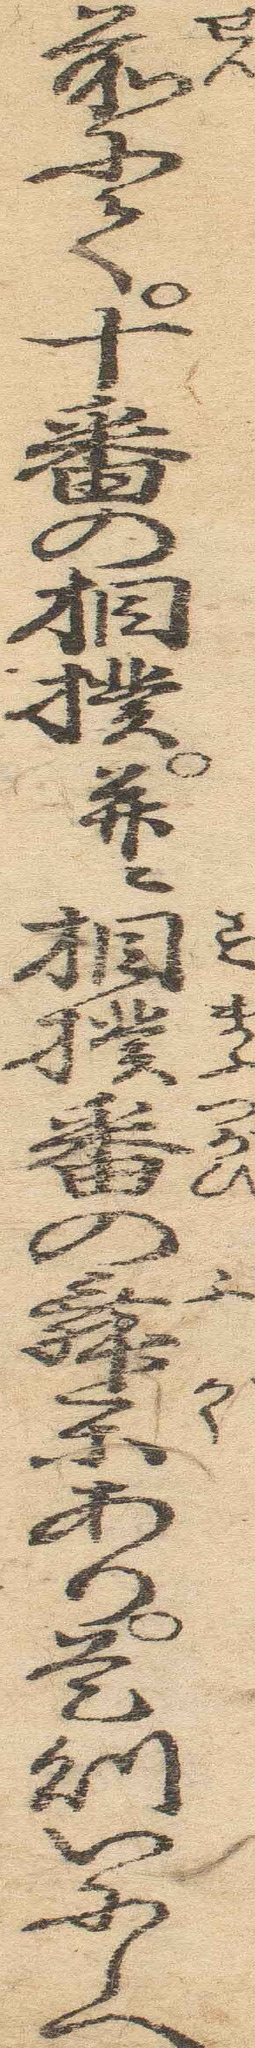前にて。十番の相撲。并に相撲番の舞楽あり。是則いにしへ
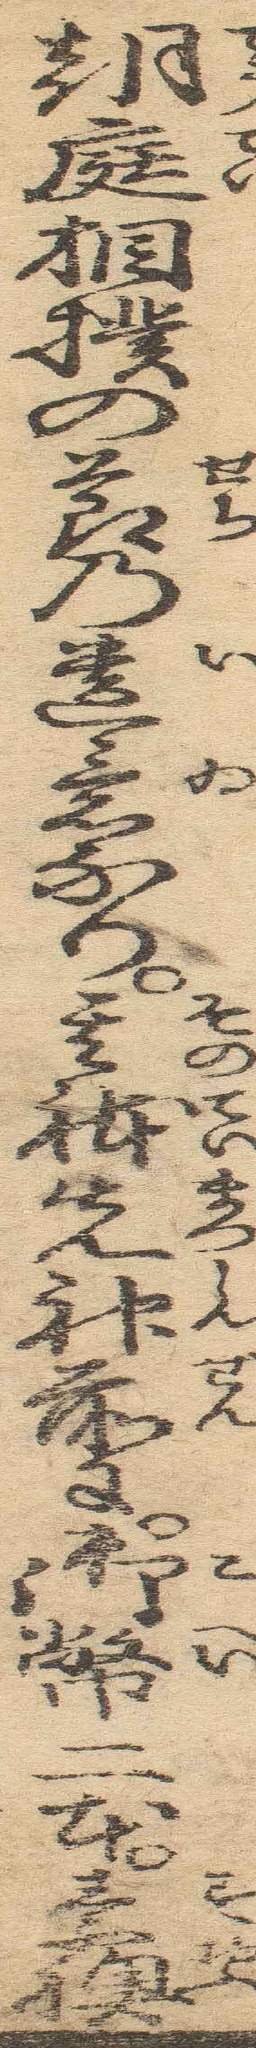朝庭相撲の節の違意なり。其体先神前に。御幣二本。素襖
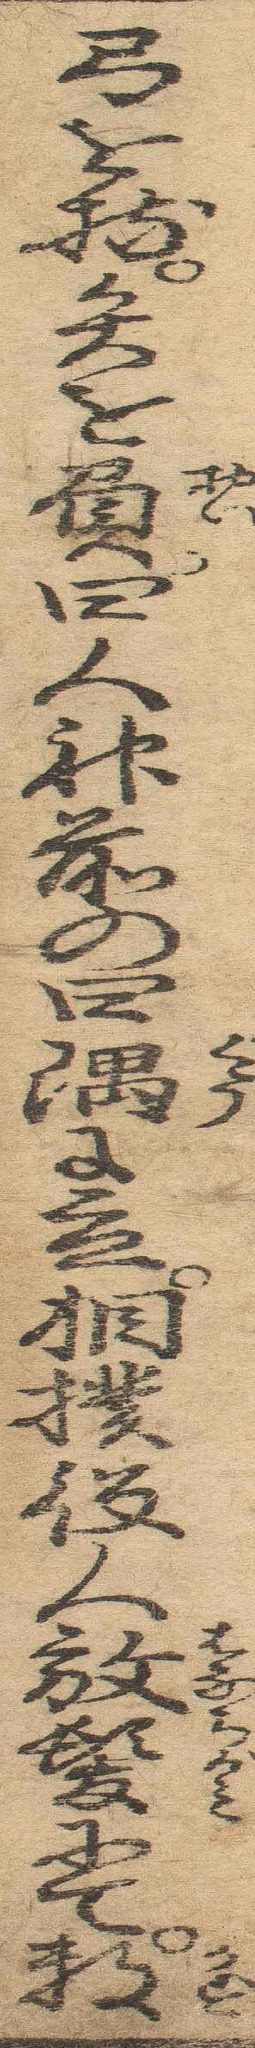弓を持。矢を負。四人神前の四隅に立。相撲役人放髪にて。数

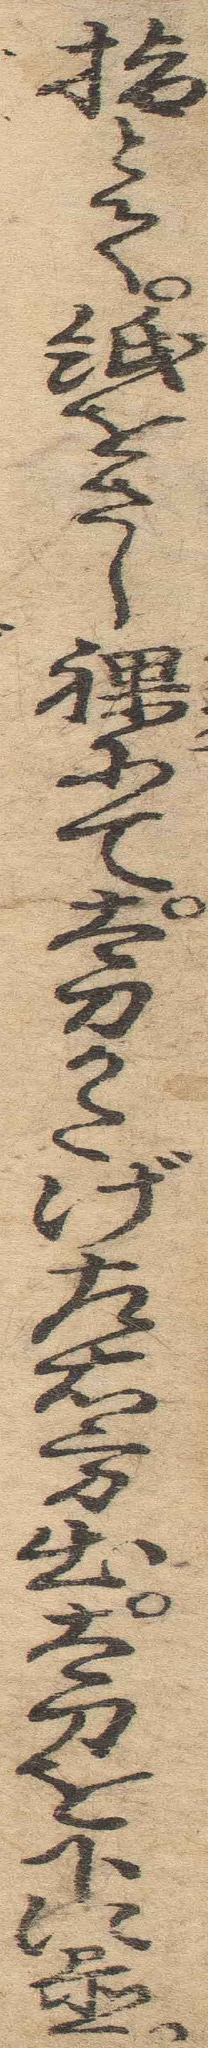指とて。紙をさし裸にて。太刀かたげ左右方出。太刀を下に置。
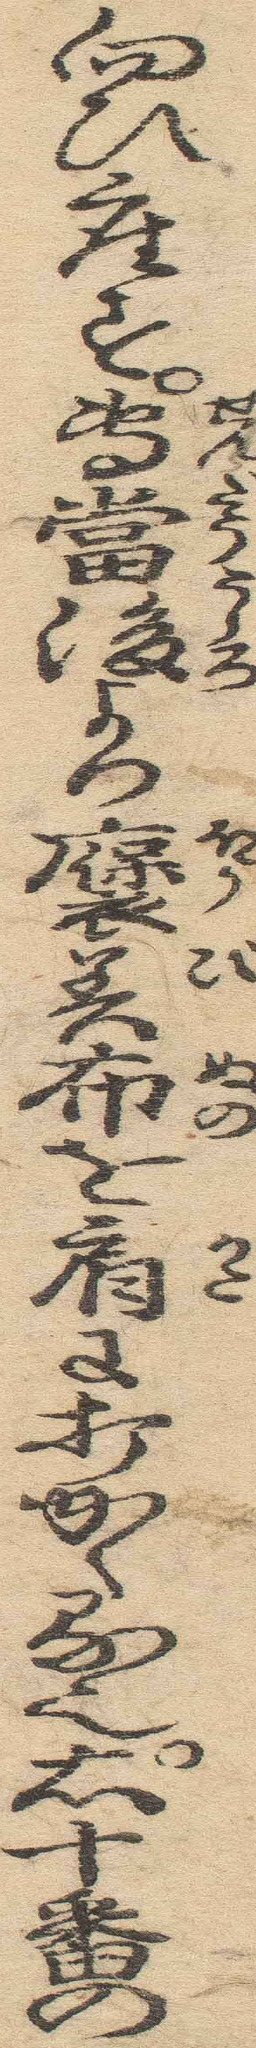向ひ座す。専当後より褒美布を肩に打かゝる也。右十番の
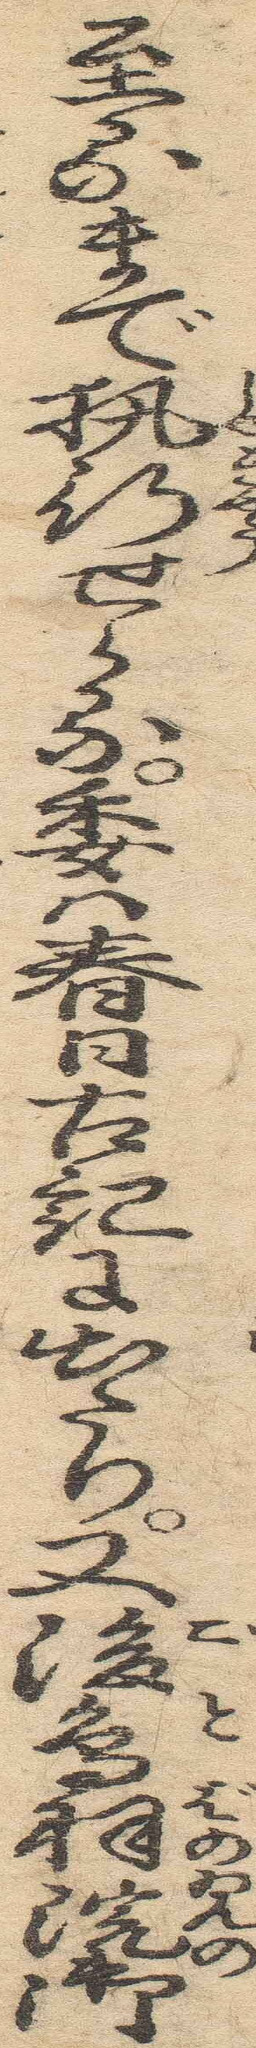至るまで執行せらる。委は春日古記に出たり。又後鳥羽院御
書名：古今相撲大全
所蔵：東京学芸大学附属図書館 国文学研究資料館
